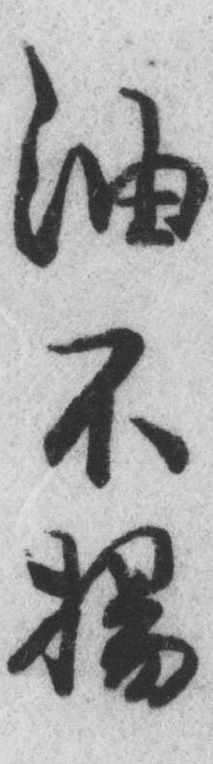油不揚
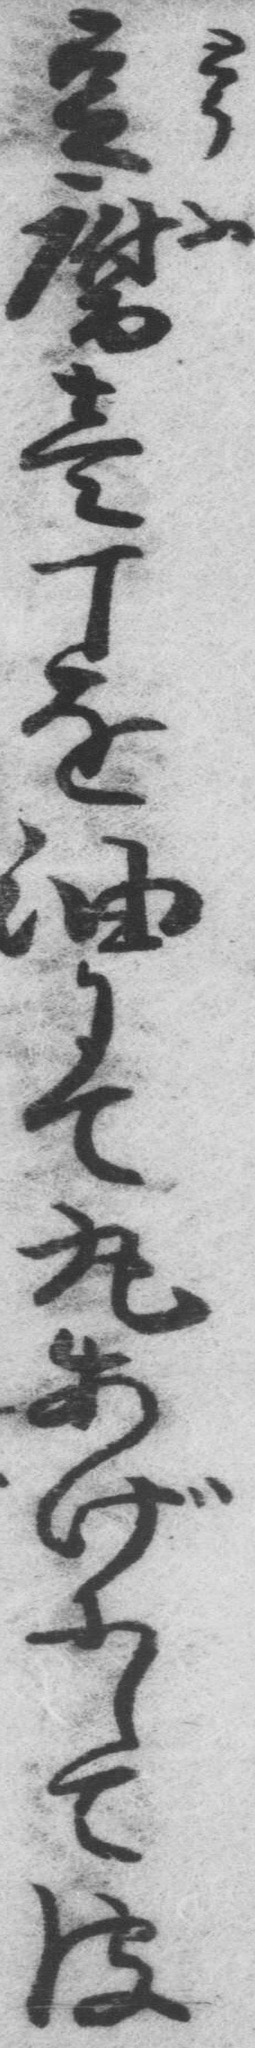豆腐壱丁を油にて丸あげにして皮
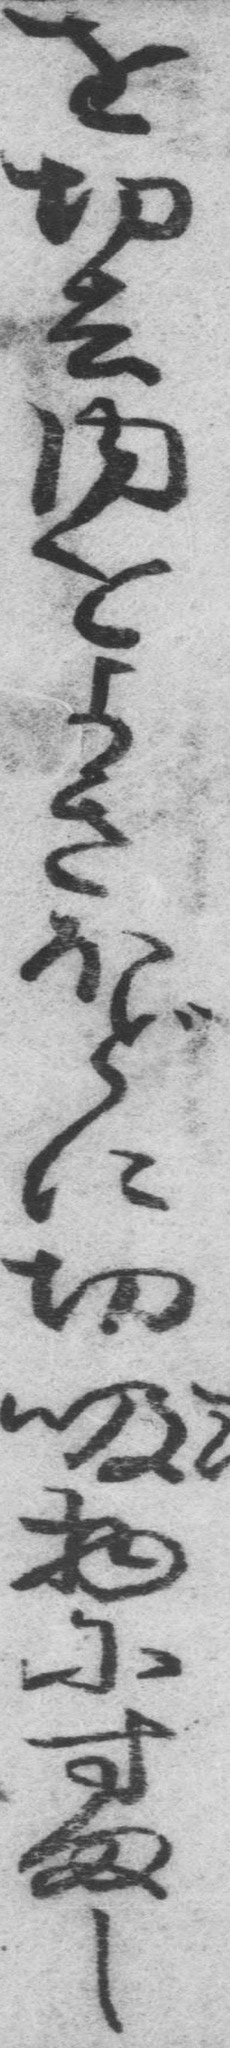を切去内をよきほどに切吸物にすまし
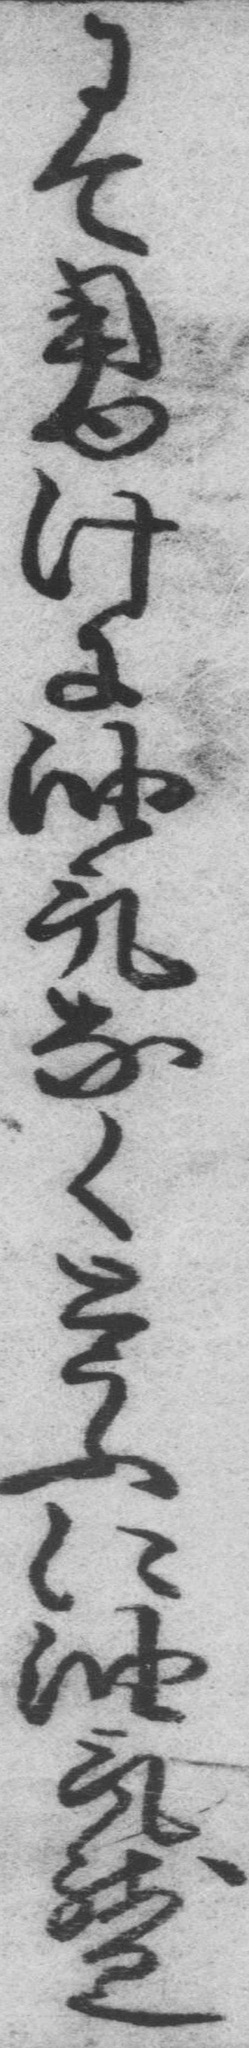にて用ゆ汁に油気なくとううふに油気残る也
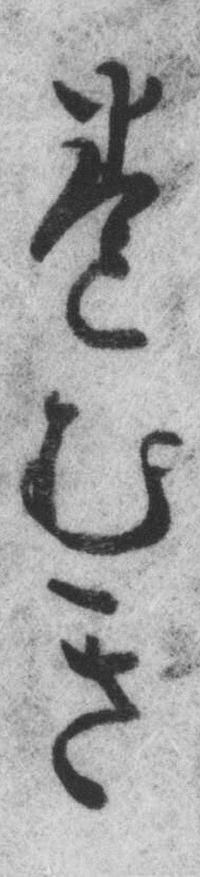巻むき
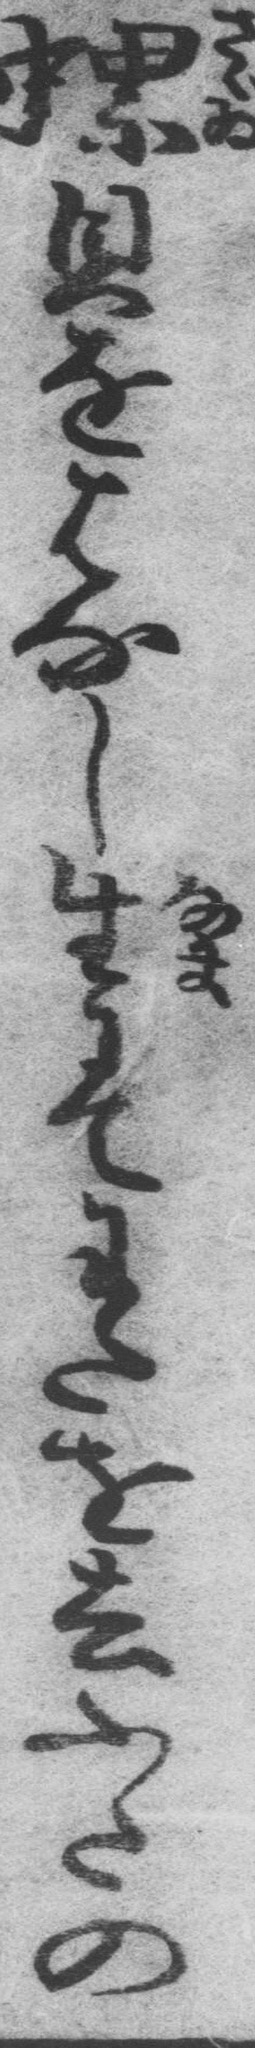螺貝をはなし生にてわたを去ふたの

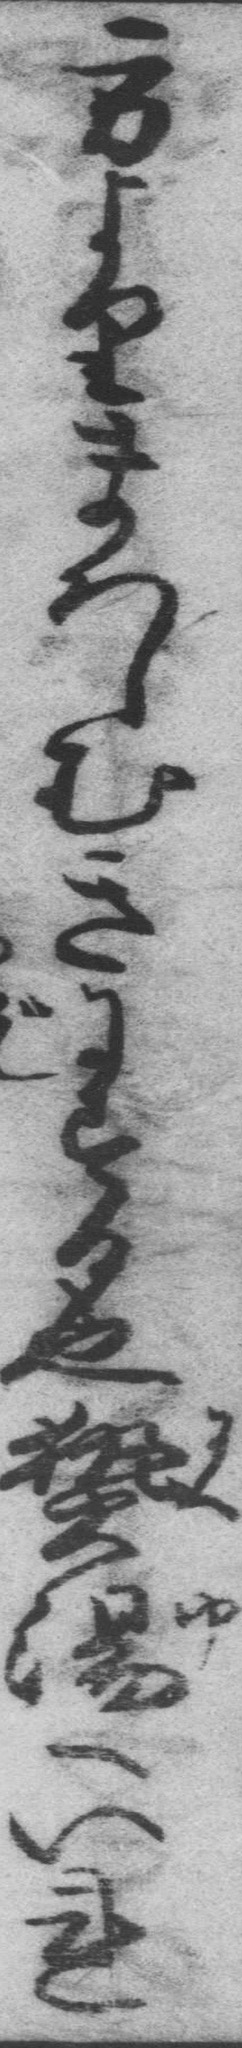方よりまはしむきにする也煮湯へいれ
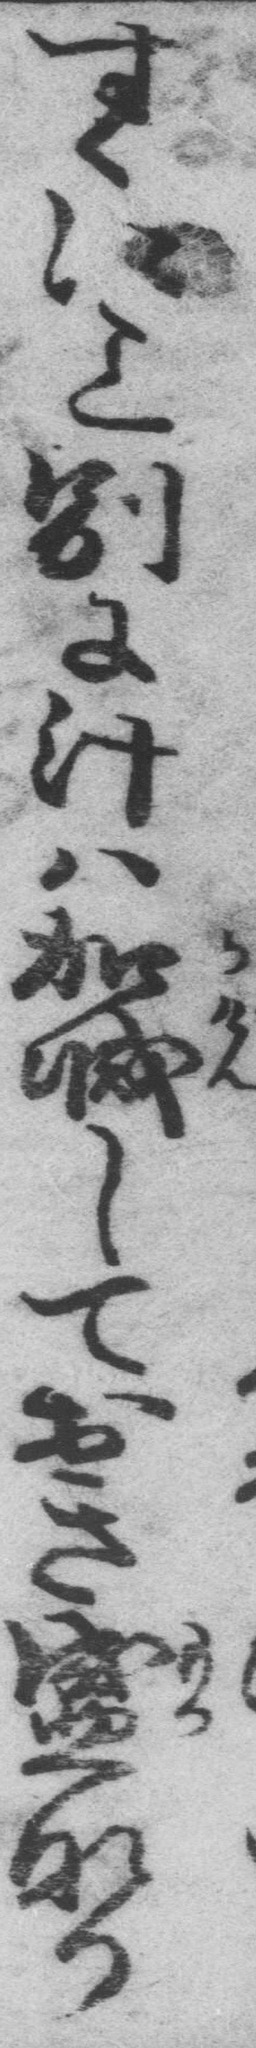すくに上別に汁は加減しておき盛なり
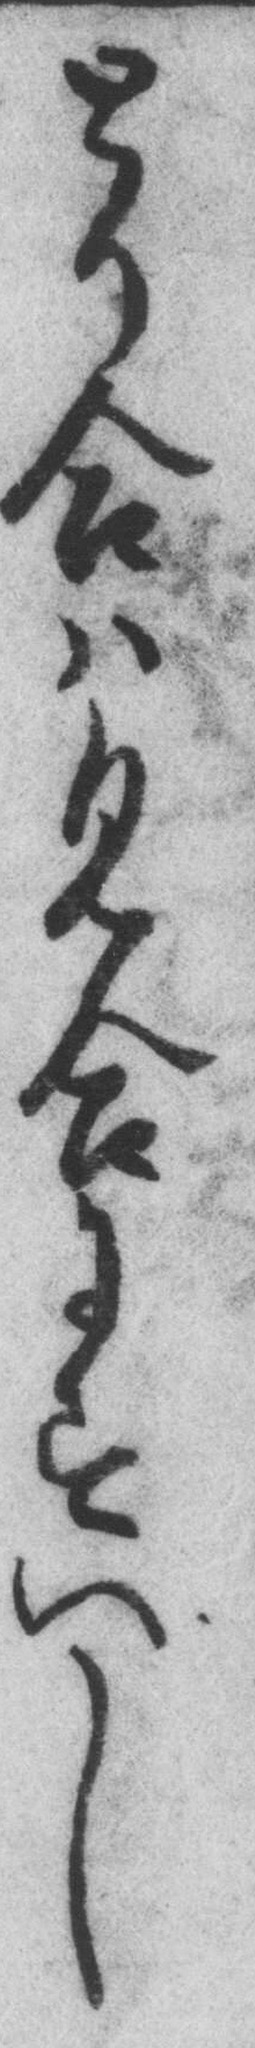とり合は見合にすへし
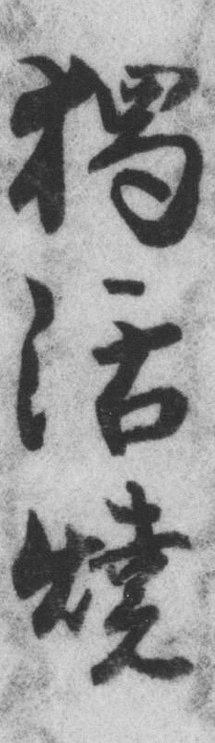独活焼
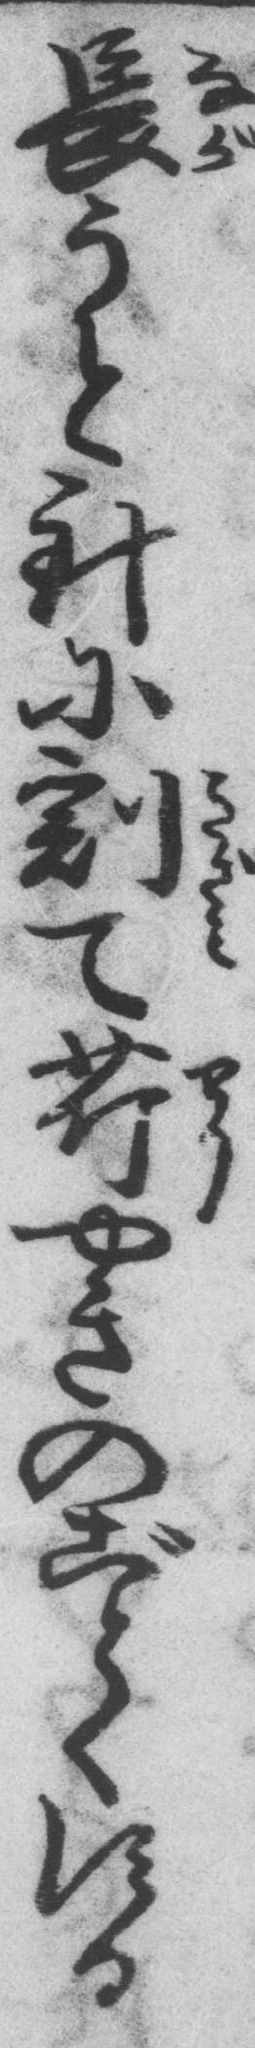長うと針に割て芹やきのごとくする
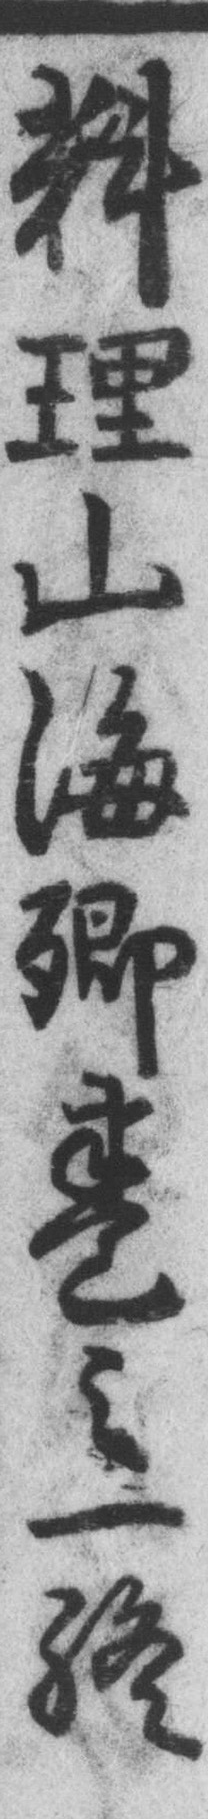料理山海郷巻之一終

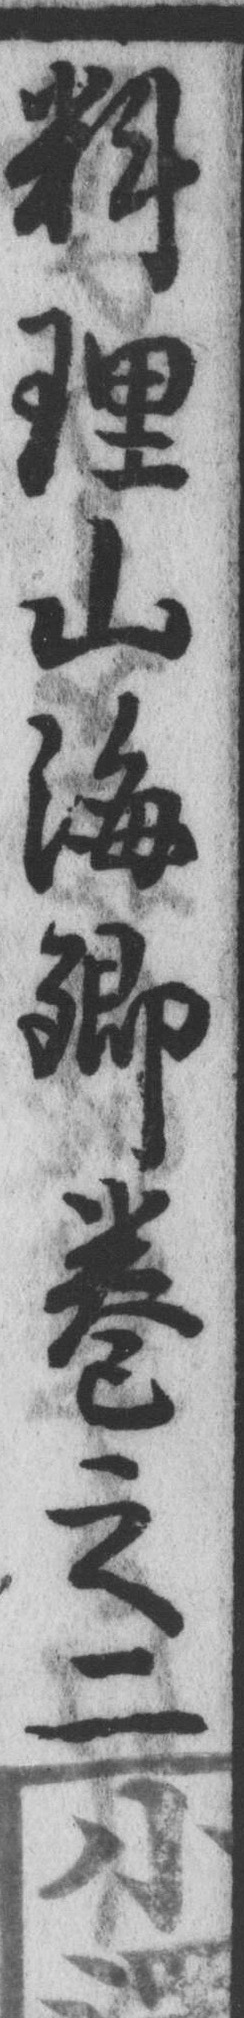料理山海郷巻之二
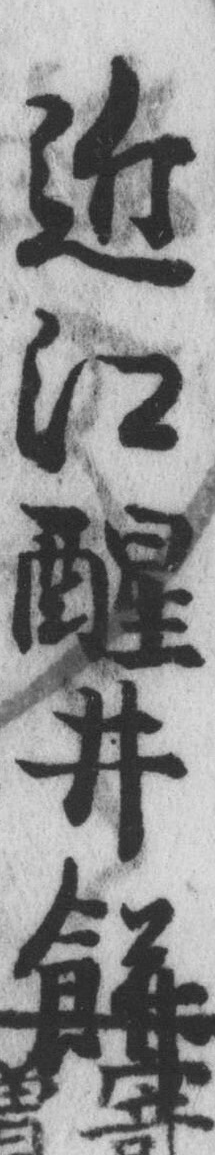近江醒井餅
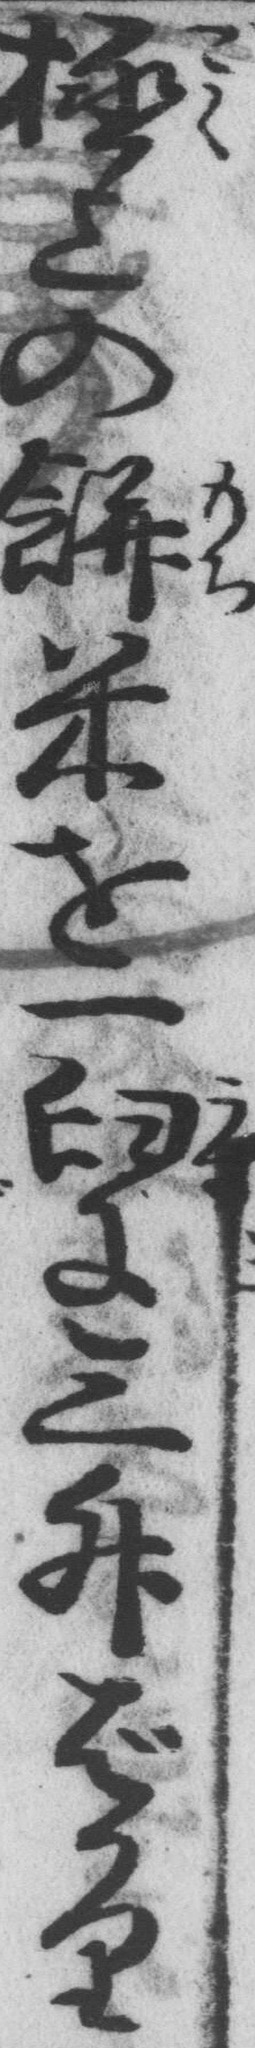極上の餅米を一臼に三升ばかり入れ
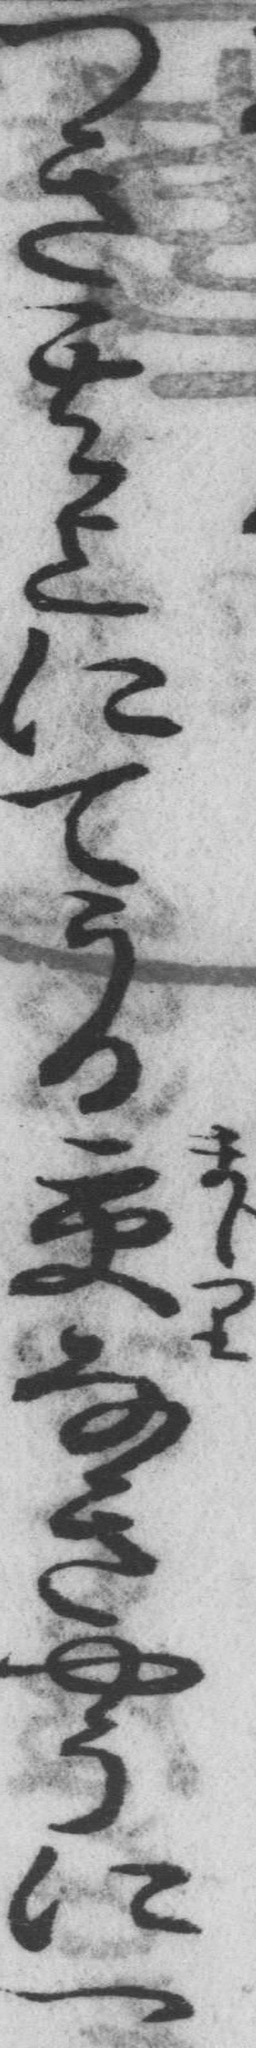つき其上にてうる交なきやうに一つぶ
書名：料理山海郷
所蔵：大阪府立大学学術情報センター 国文学研究資料館
